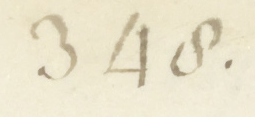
348.
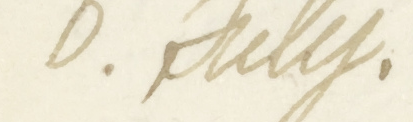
6 Julij.
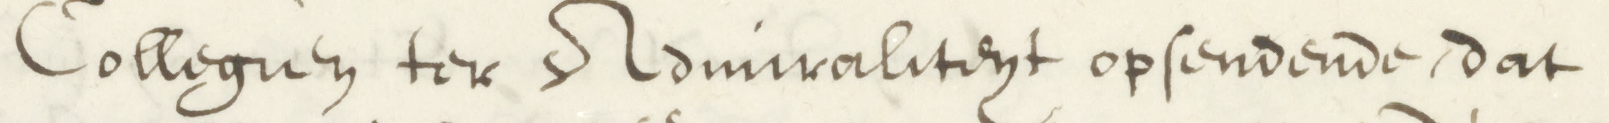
Collegien ter Admiraliteyt opsendende, dat
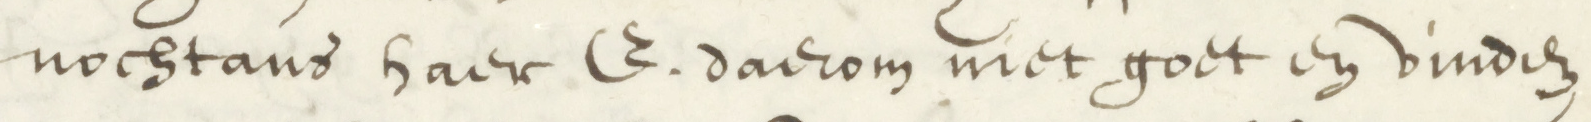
nochtans haer E. daerom niet goet en vinden
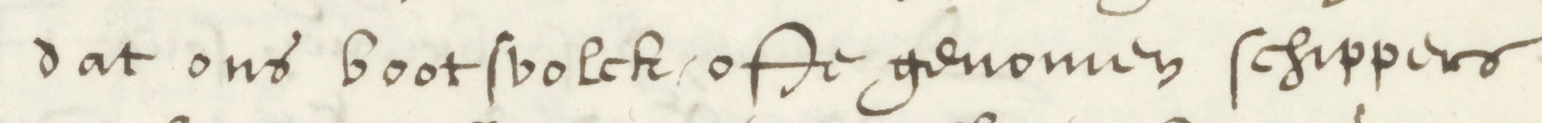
dat ons bootsvolck, ofte genomen schippers
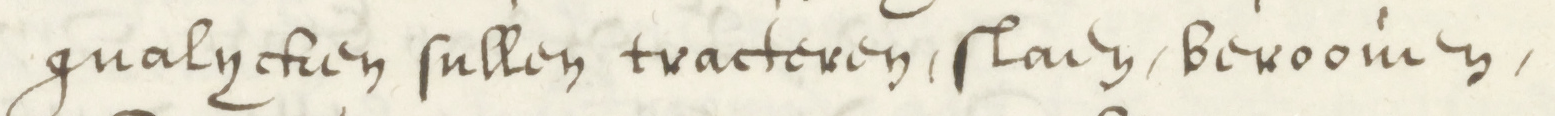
qualycken sullen tracteren, slaen, beroouen,
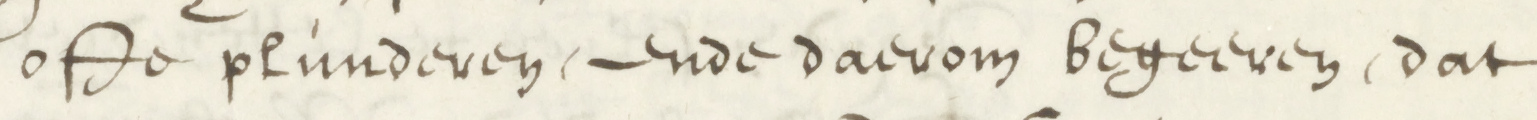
ofte plunderen. Ende daerom begeeren, dat
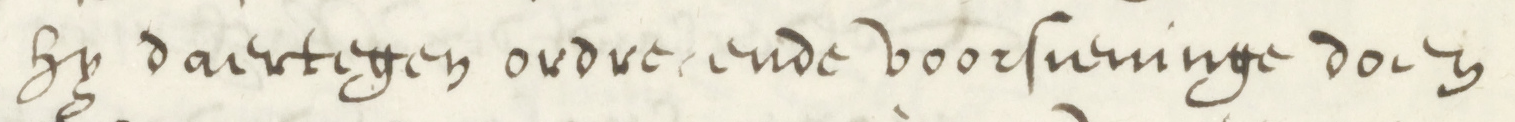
hy daertegen ordre, ende voorsieninge doen
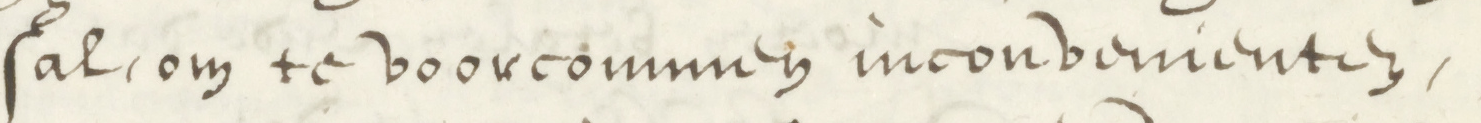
sal, om te voorcommen inconvenienten,
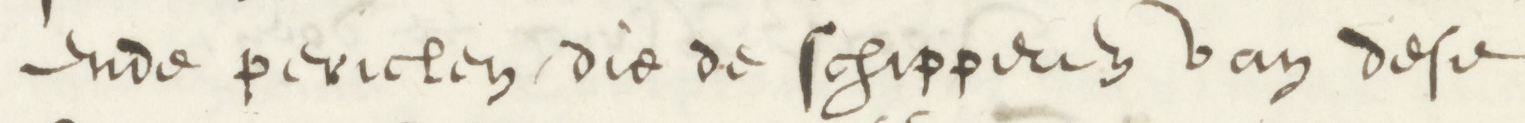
ende periclen, die de schipperen van dese
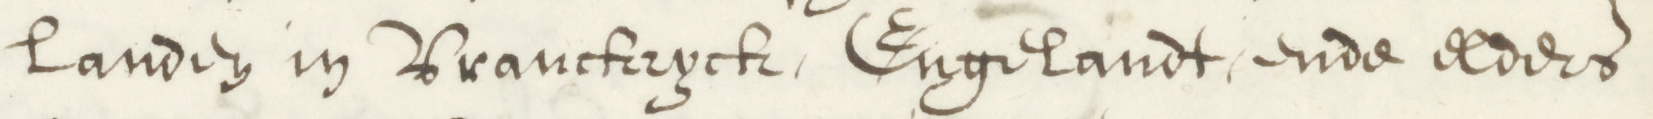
landen in Vranckryck, Engelandt, ende elders
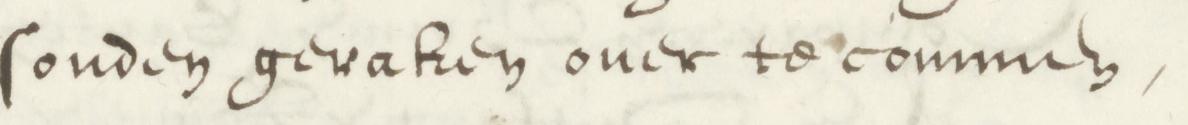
souden geraken ouer te commen.
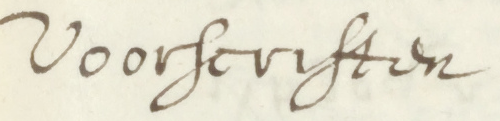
Voorscriften
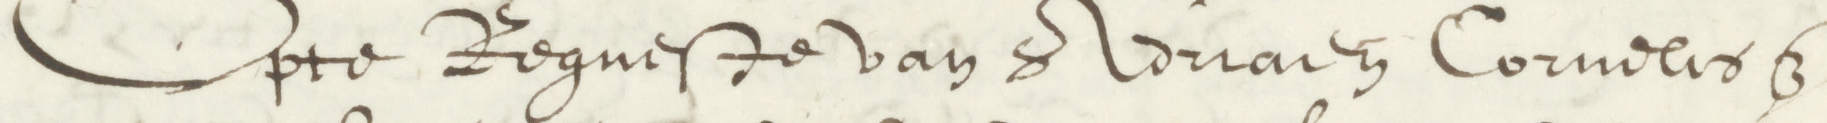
Opte Requeste van Adriaen Cornelisz
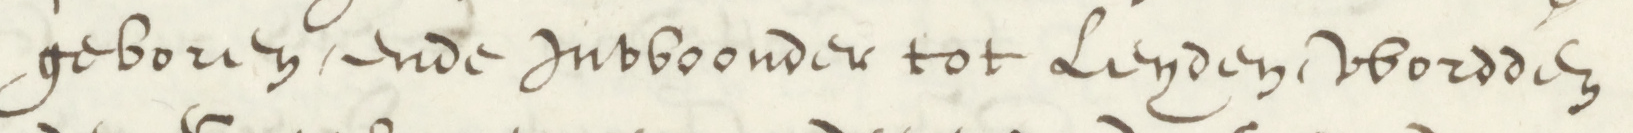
geboren, ende inwoonder tot Leyden, wordden
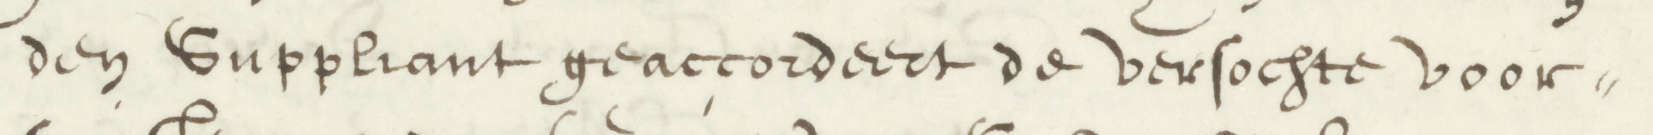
den Suppliant geaccoordeert de versochte voor„
